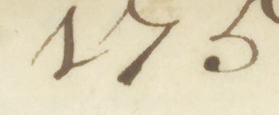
175
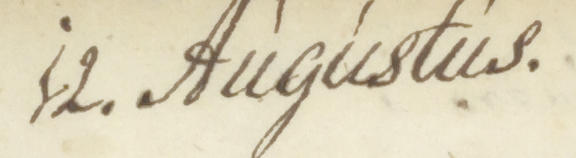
12. Augustus.
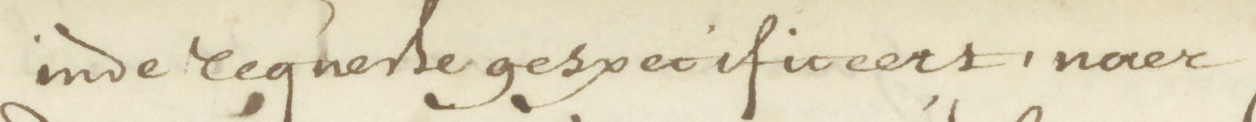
inde requeste gespecificeert, naer
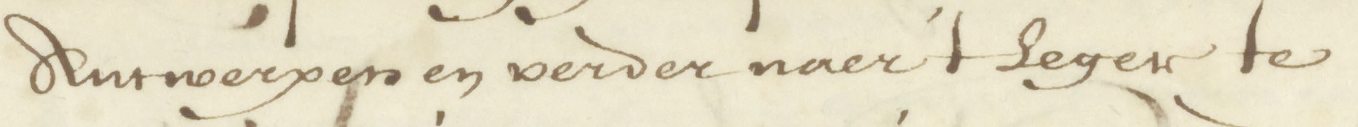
Antwerpen en verder naer ‛t leger te
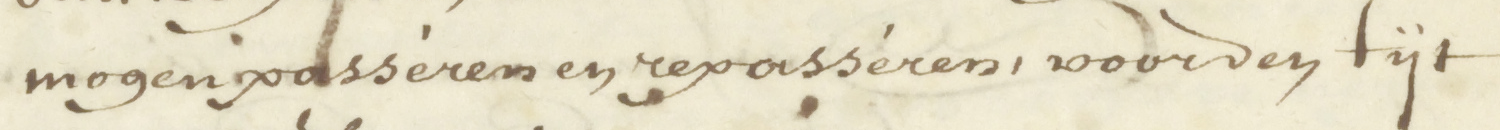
mogen passéren en repasséren, voor den tijt
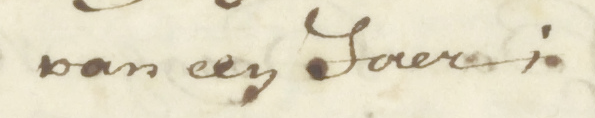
van een Jaer;
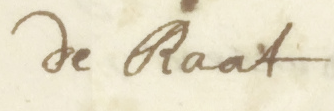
de Raat
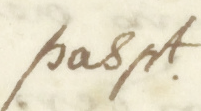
paspt.
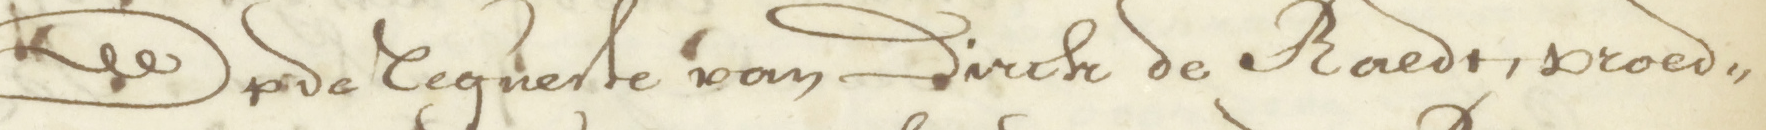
Opde Requeste van Dirck de Raedt, vroed„
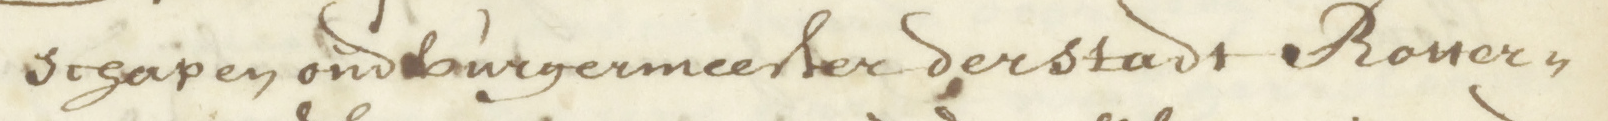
schap en oud burgermeester der stadt Rotter„
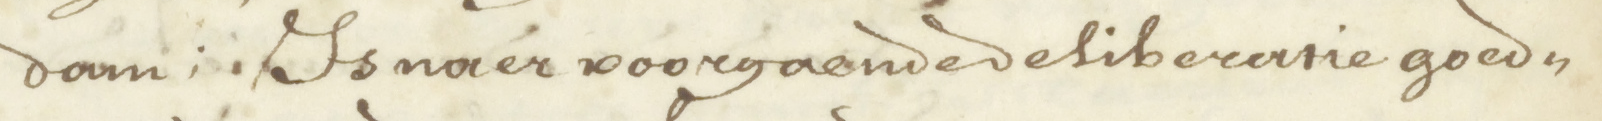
dam; Is naer voorgaende deliberatie goed„
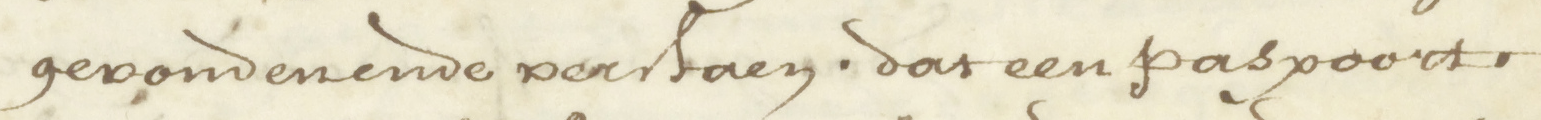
gevonden ende verstaen, dat een paspoort,
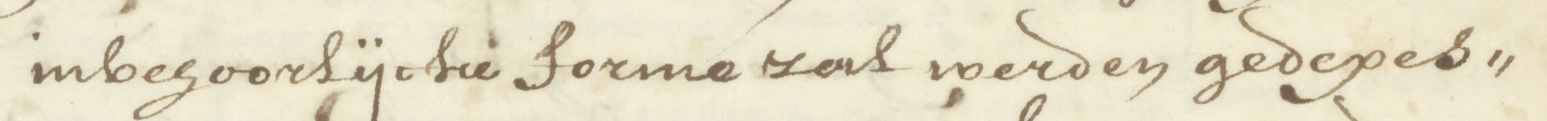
in behoorlijcke forme zal werden gedepes„
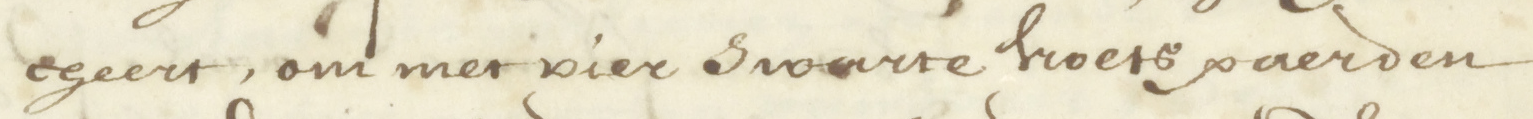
cheert, om met vier Swarte koets paerden
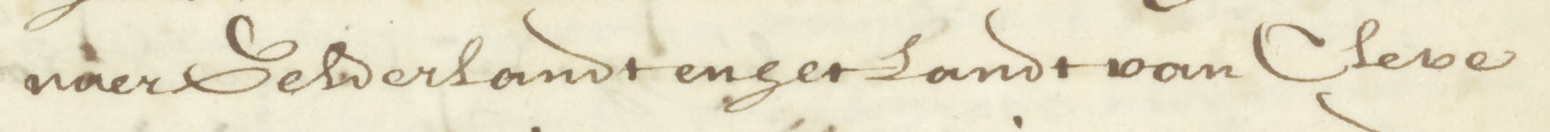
naer Gelderlandt en het landt van Cleve
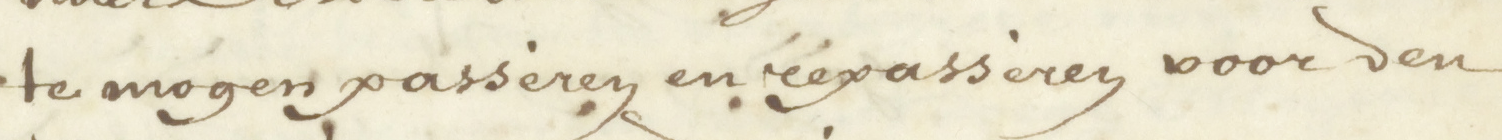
te mogen passéren en repasséren voor den
